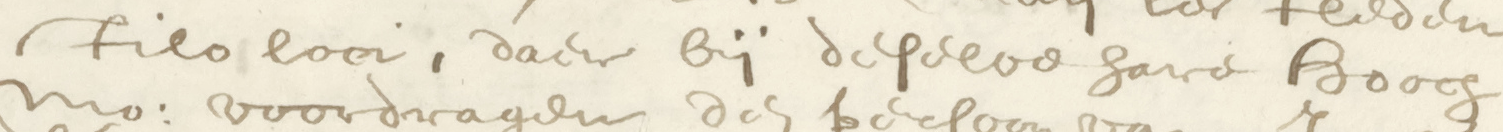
stilo loci, daer bij deselve hare Hooch
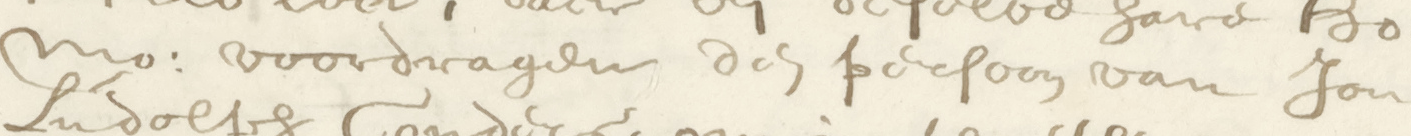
Mo: voordragen den persoon van Jonr.
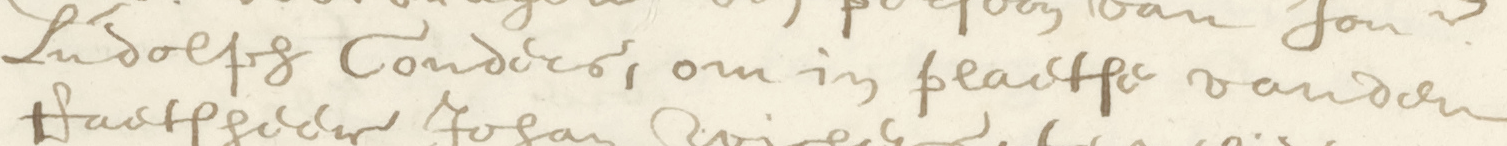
Ludolph Conders, om in plaetse vanden
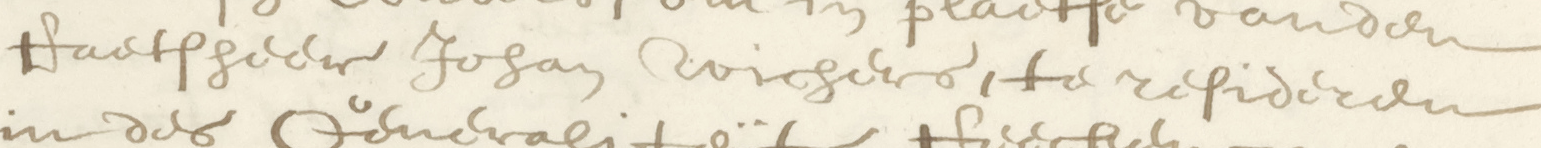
Raetsheer Johan wichers, te resideren
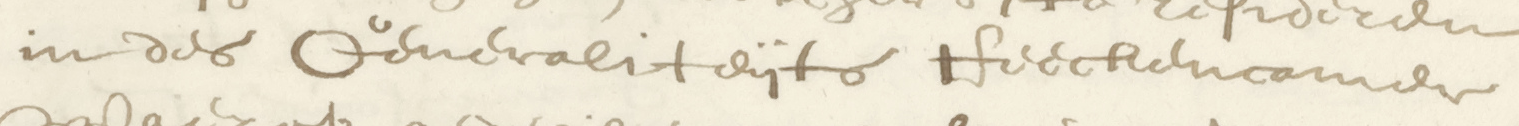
in des Generaliteijts Reeckencamer.
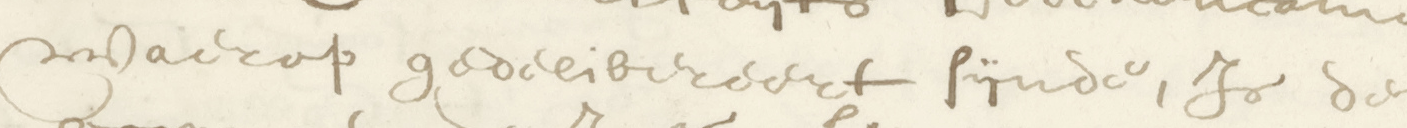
Waerop gedelibereert sijnde, Is de
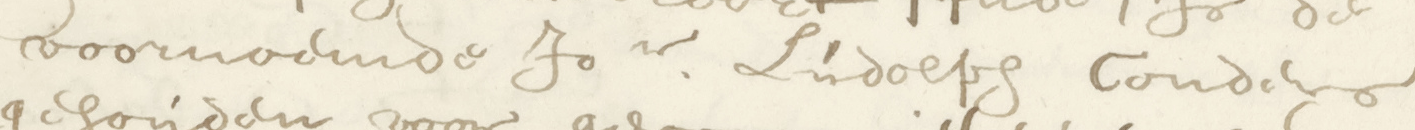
voornoemde Jor. Ludolph Conders
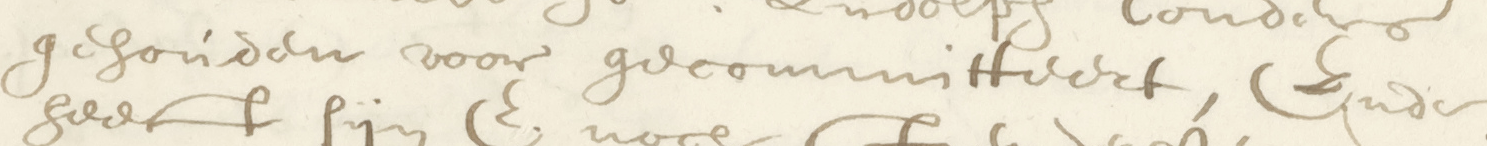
gehouden voor gecommitteert, Ende
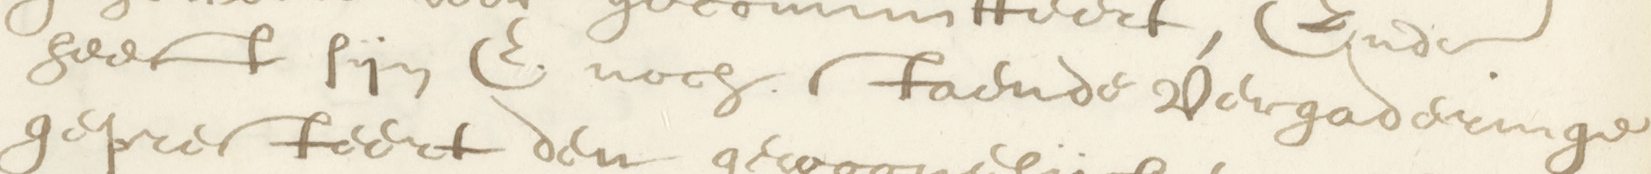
heeft sijn E. noch staende Vergaderinge
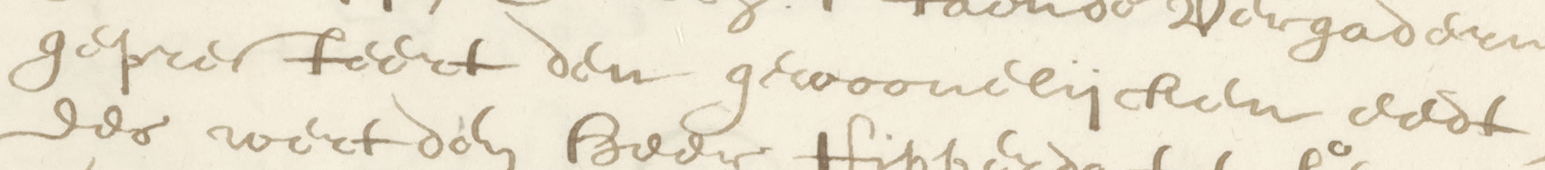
gepresenteert den gewoonelijcken eedt.
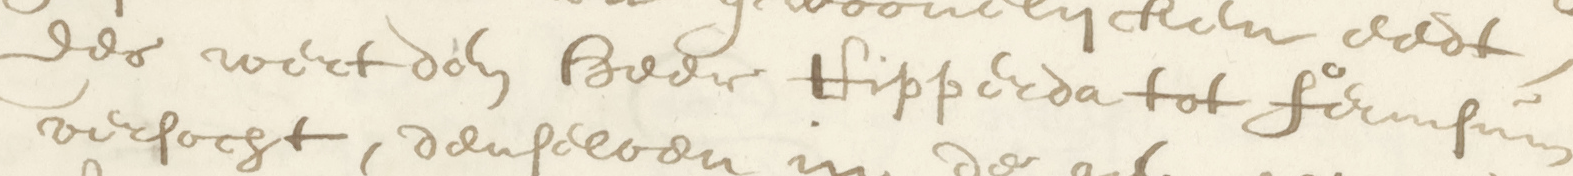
des wert den Heer Ripperda tot Fermsum
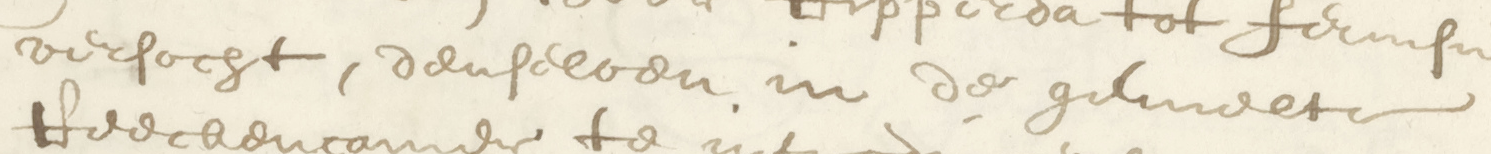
versocht, denselven in de gemelte
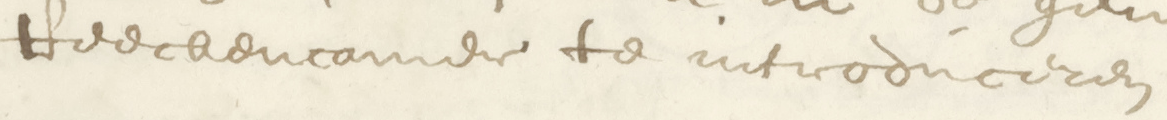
Reeckencamer te introduceren
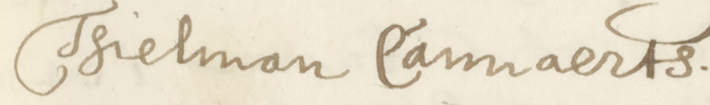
Thielman Cannaerts.
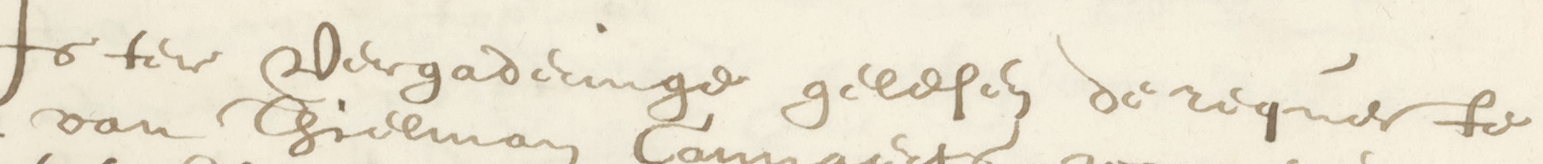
Is ter Vergaderinge gelesen de requeste
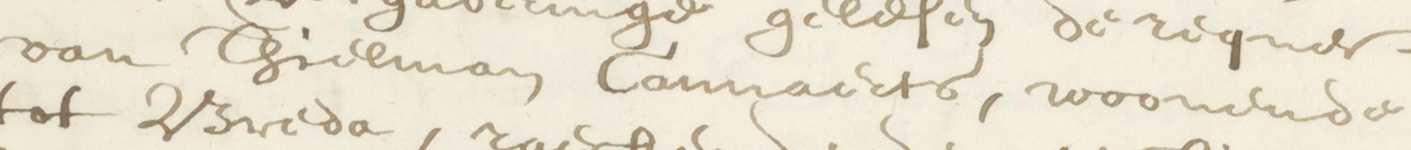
van Thielman Cannaerts, woonende
